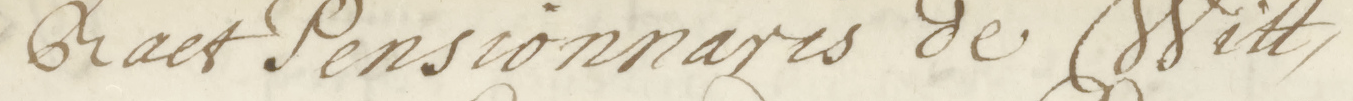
Raet Pensionnaris de Witt,
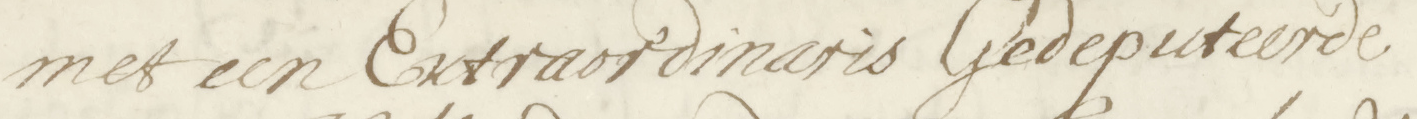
met een Extraordinaris Gedeputeerde
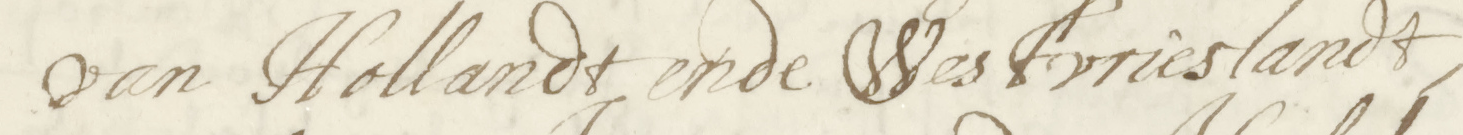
van Hollandt ende Westvrieslandt,
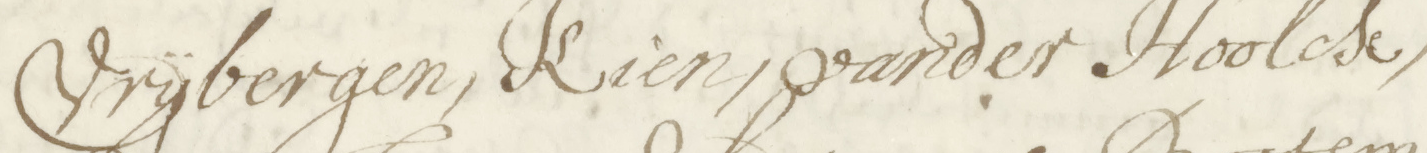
Vrijbergen, Kien, vander Hoolck,
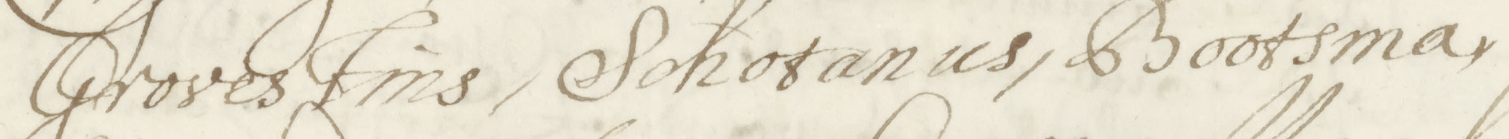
Grovestins, Schotanus, Bootsma,
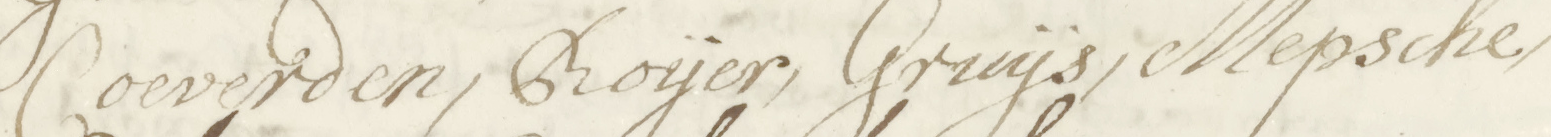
Coeverden, Roijer, Gruijs, Mepsche,
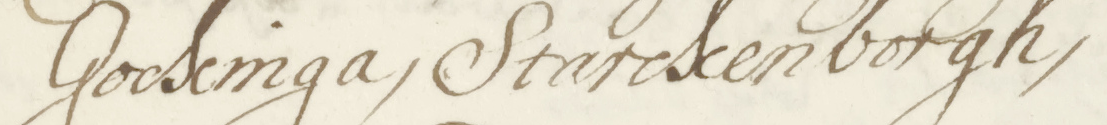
Gockinga, Starckenborgh,
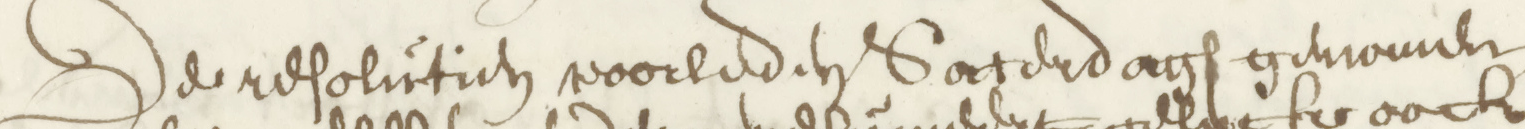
De resolutien voorleden Saterdagh genomen
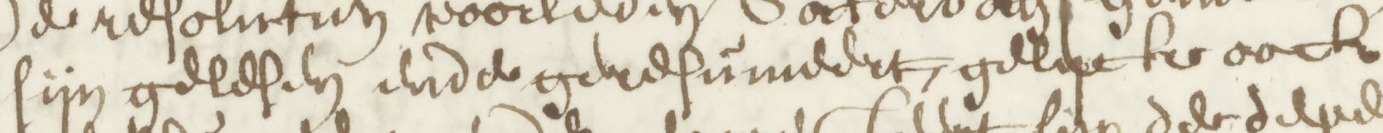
sijn gelesen ende geresumeert, gelijck oock
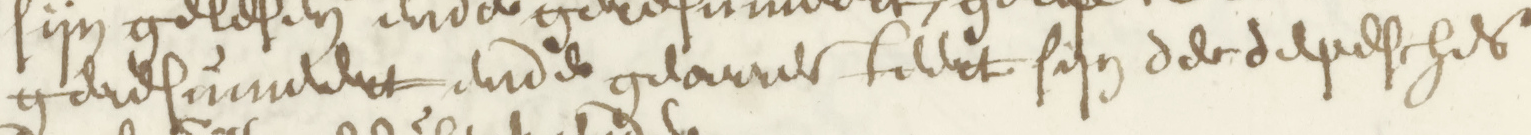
geresumeert ende gearresteert sijn de depesches
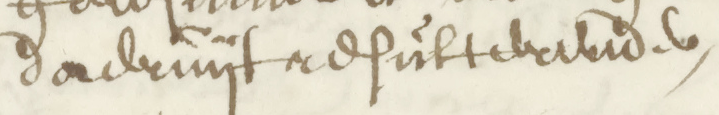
daeruijt resulterende.
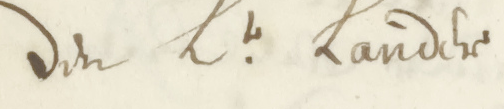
den Lt. Lander
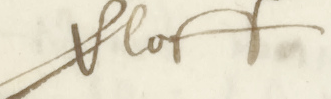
Vloff
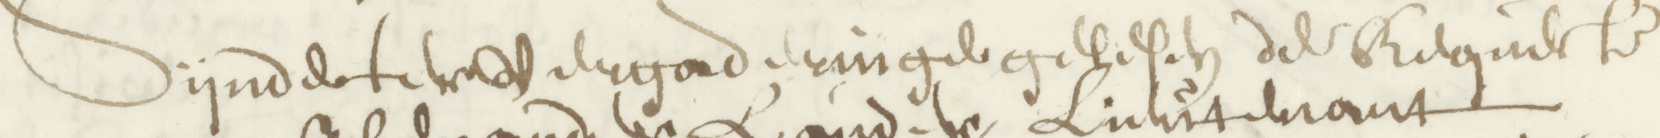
Sijnde ter Vergaderinge gelesen de Requeste
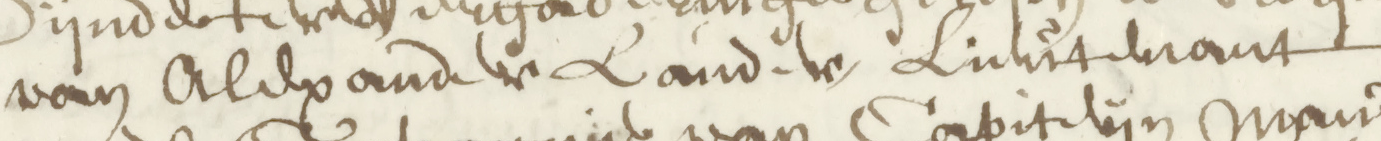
van Alexander Lander, Lieutenant
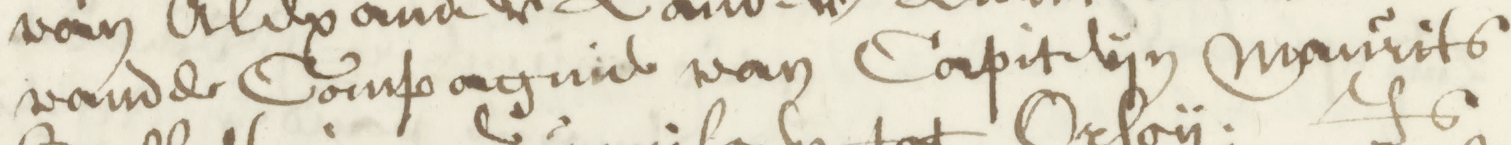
vande Compagnie van Capiteijn Maurits
